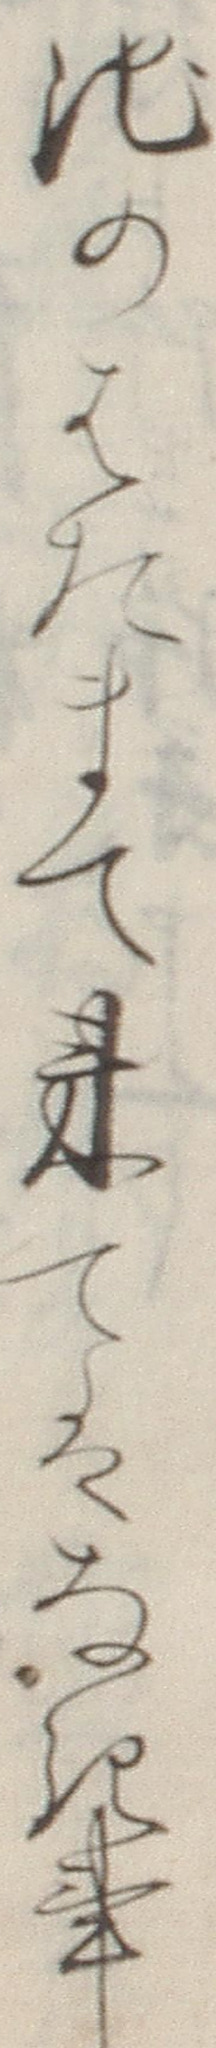池のはたまてきてはなき事
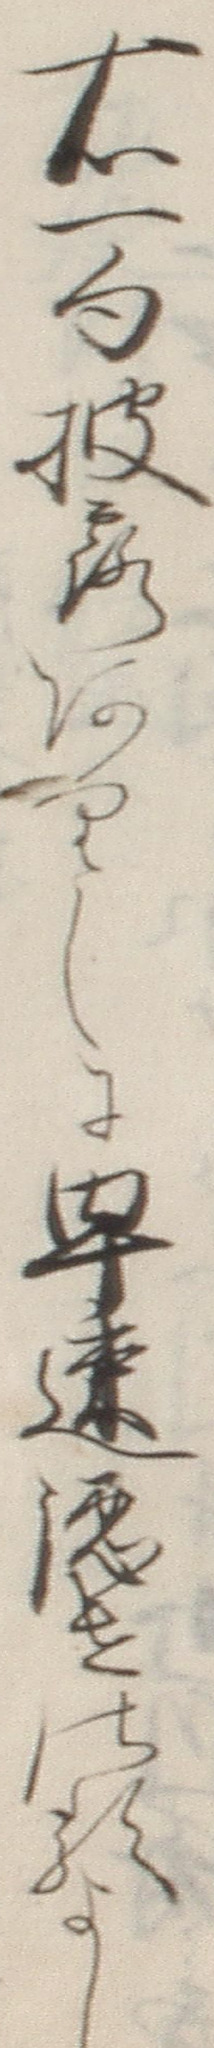右一句披露ありしに早速認遣さるよし

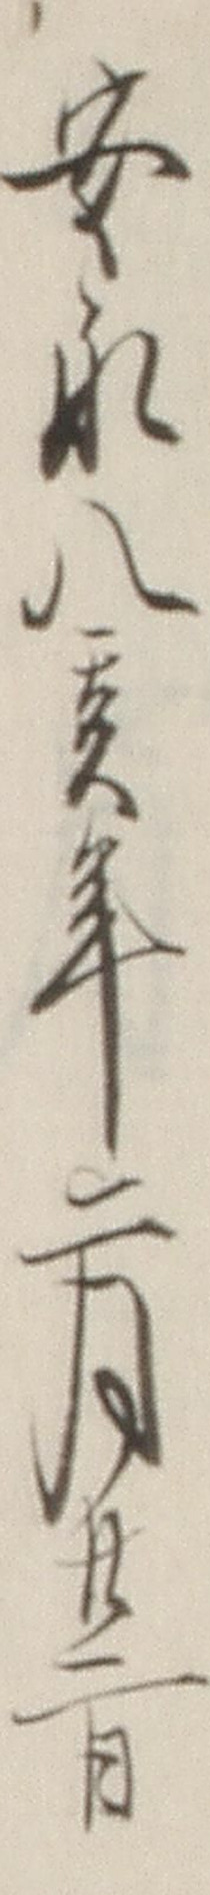安永八年亥年二月廿二日
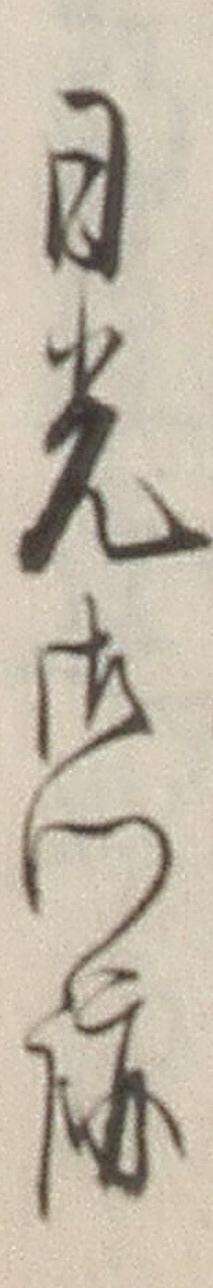日光御門跡
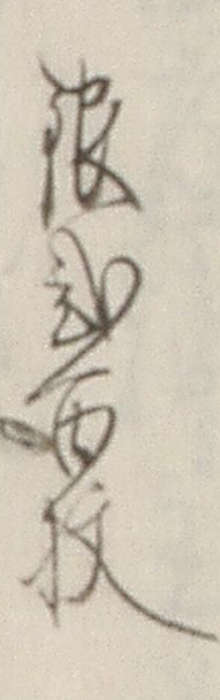銀弐百枚
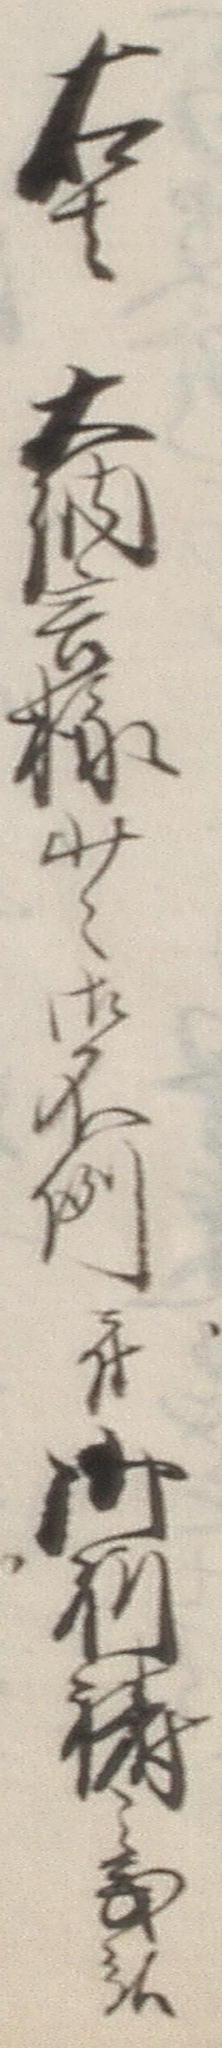右は大納言様少々御不例ニ付御祈祷之義被
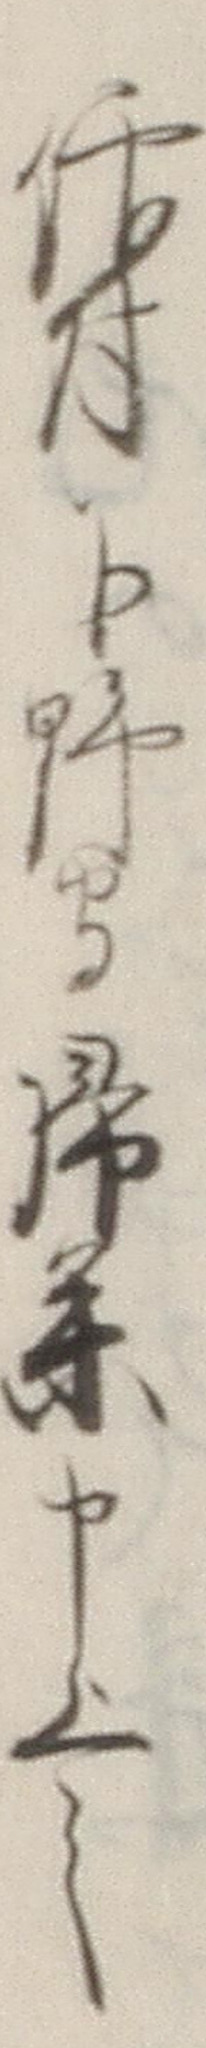仰付下野守帰参申上候
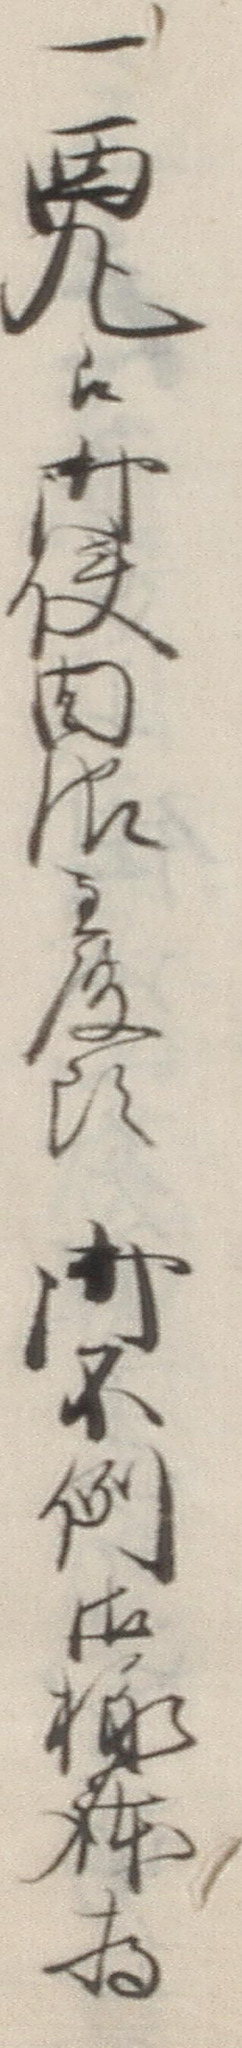一西丸え御使関根主殿頭御不例御様躰為
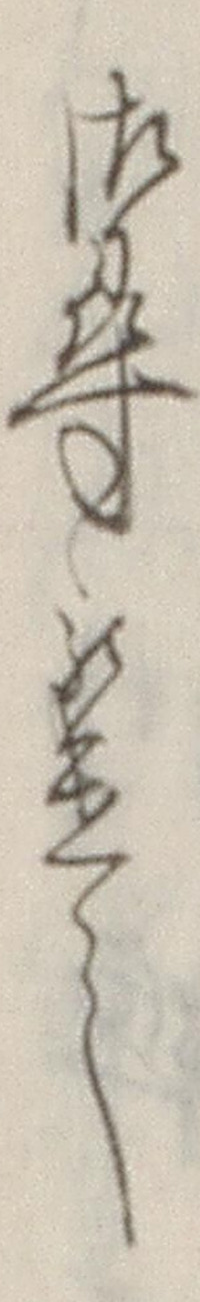御尋被遣候
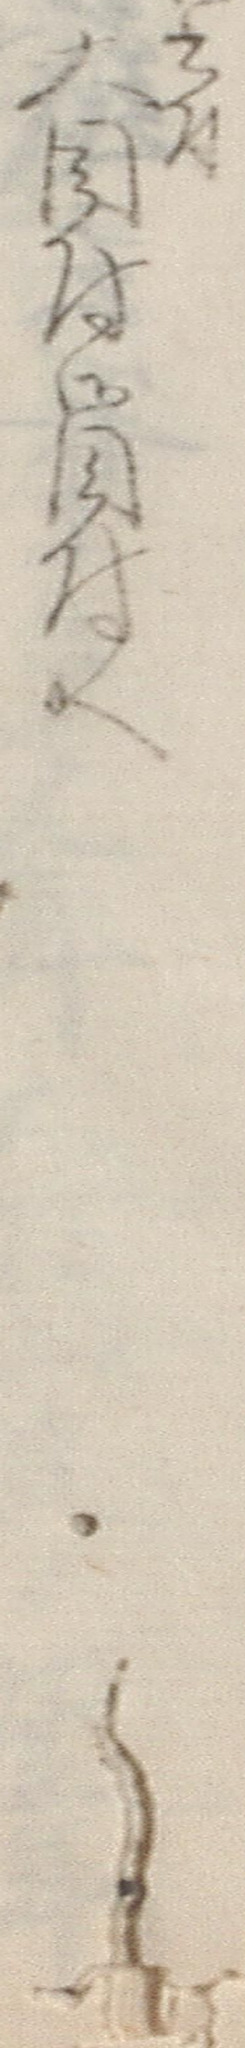大目付御目付へ
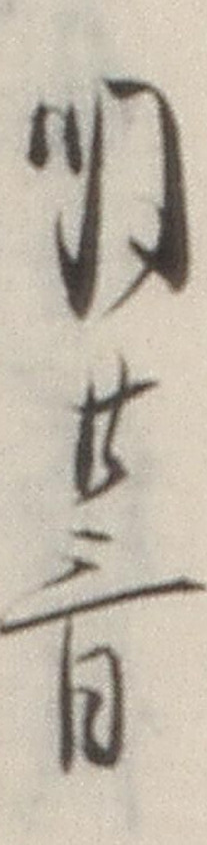明廿三日
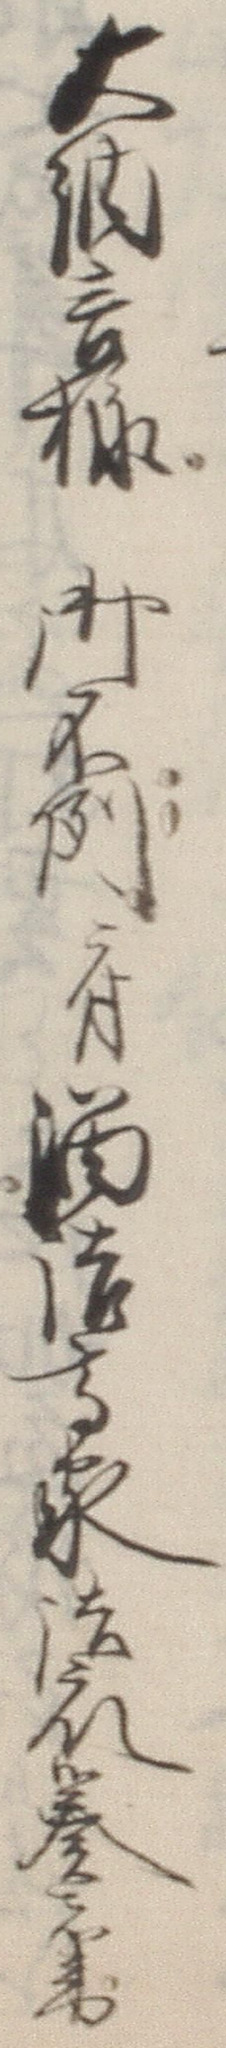大納言様御不例ニ付溜詰高家諸衆奏者番
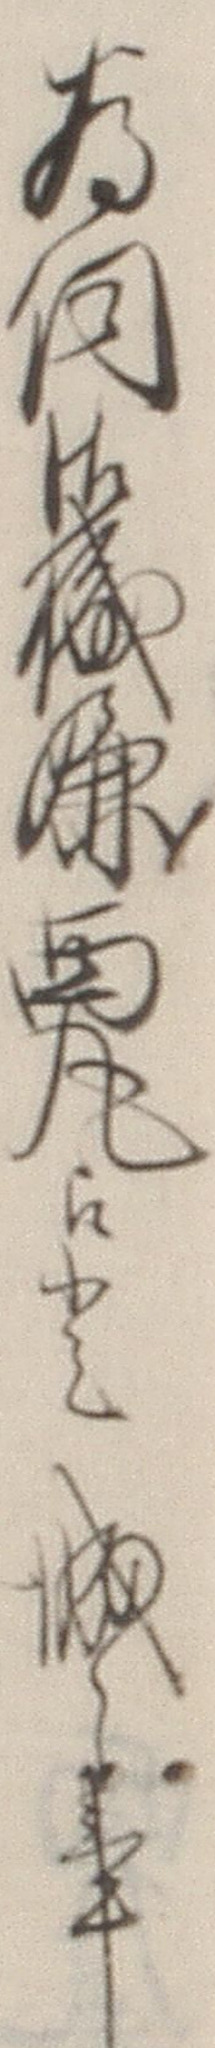為伺御機嫌西丸え登城之事
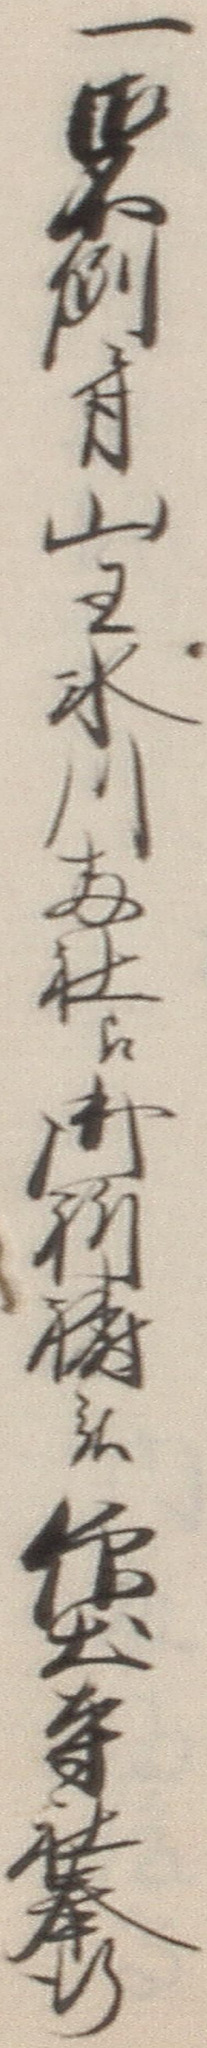一御不例ニ付山王氷川両社え御祈祷被仰出寺社奉行
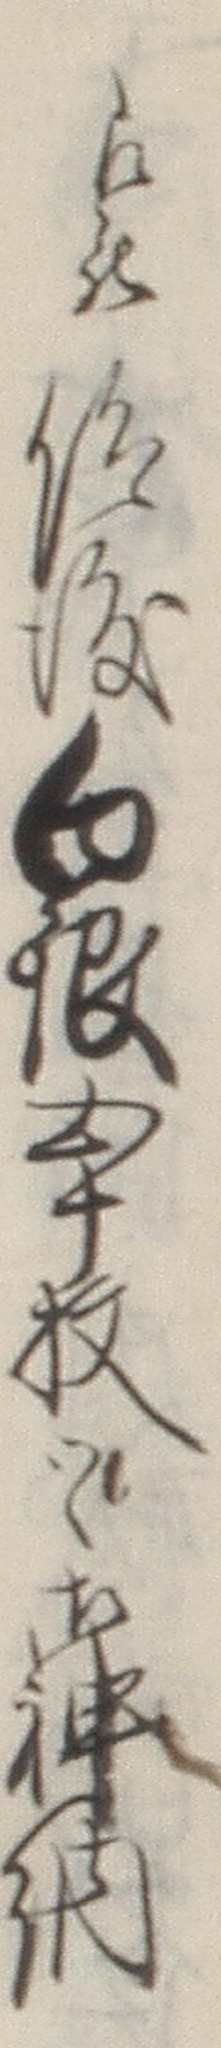え被仰渡白銀五十枚ツゝ御神納
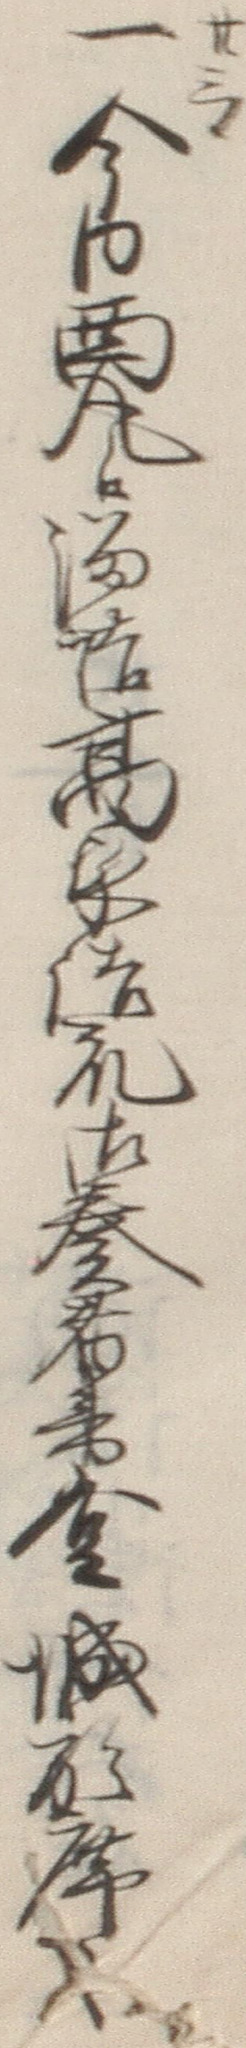一今日西丸え溜詰高家衆御奏者番登城願席
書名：[諸国災害記録]
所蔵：東京大学地震研究所図書室 Earthquake Research Institute Library, The University of Tokyo, JAPAN
